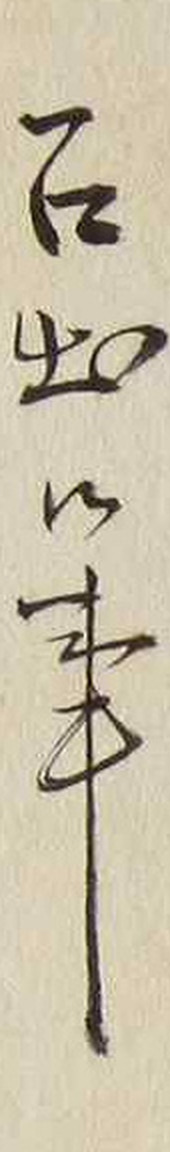召出候事

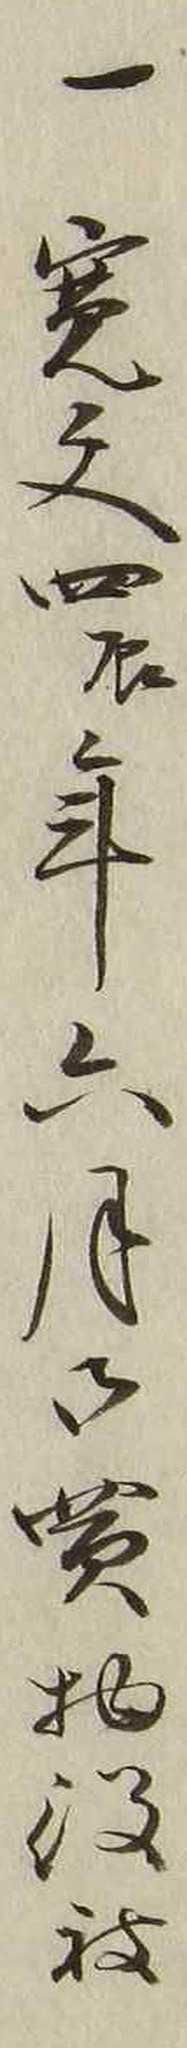一寛文四辰年六月御買物役被
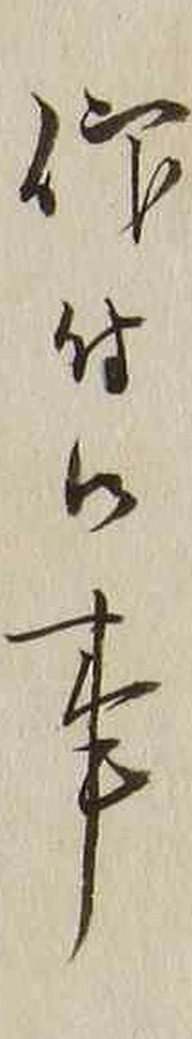仰付候事
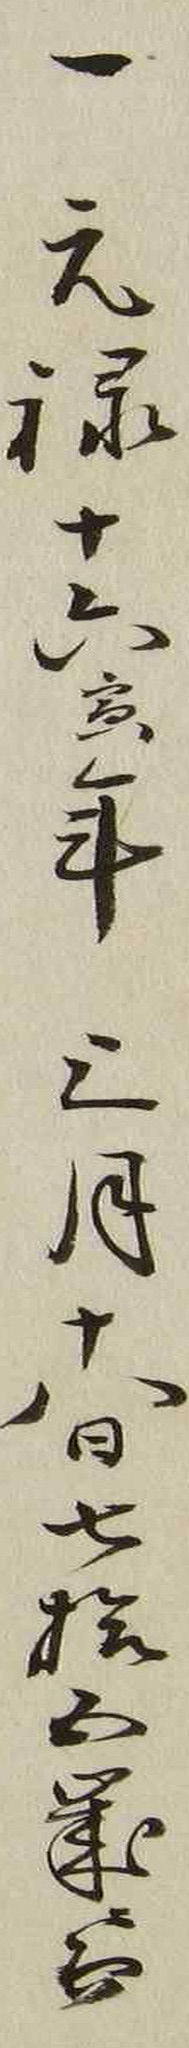一元禄十六寅年三月十八日七拾五歳ニ而
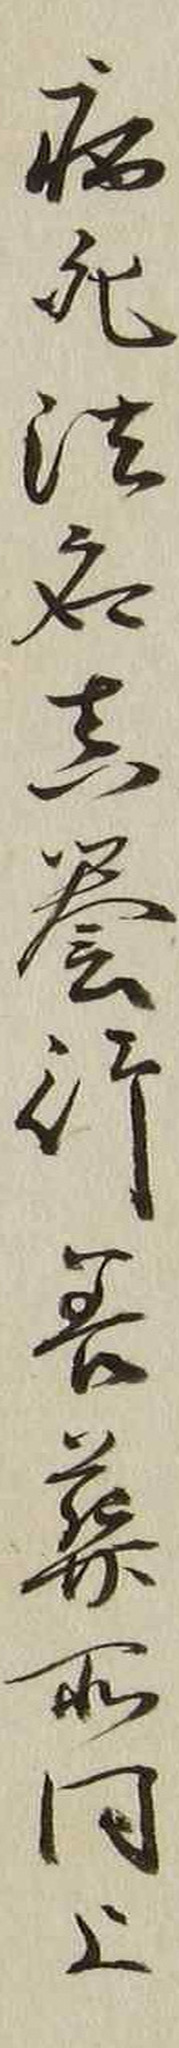病死法名真誉行善葬所同上
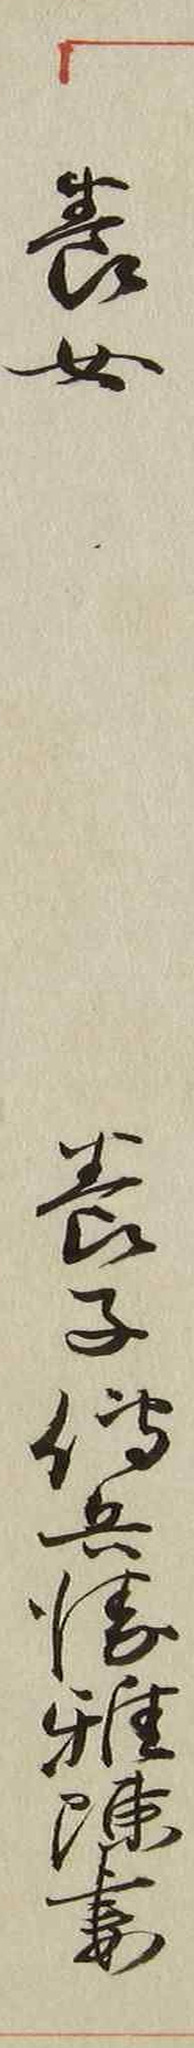養女養子伝兵衛雅諌妻
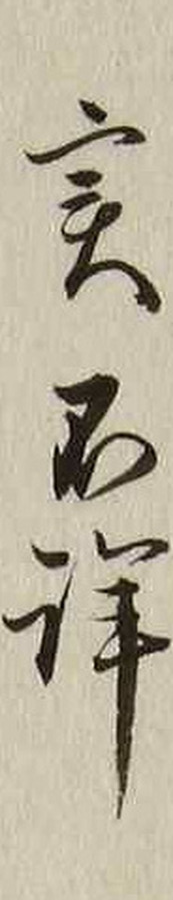実不詳
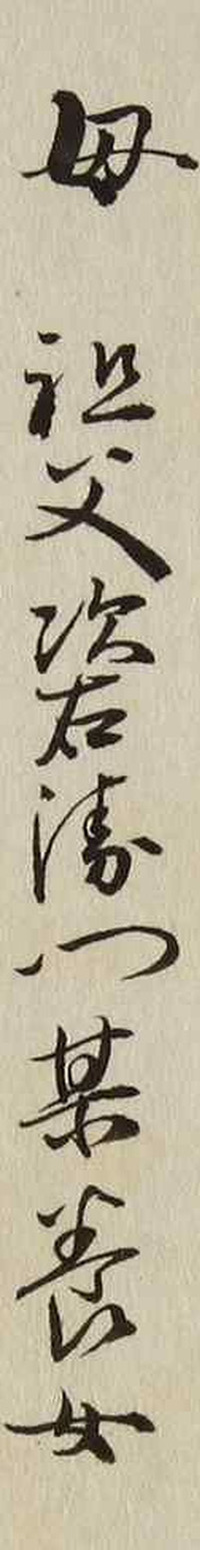母祖父次右衛門某養女
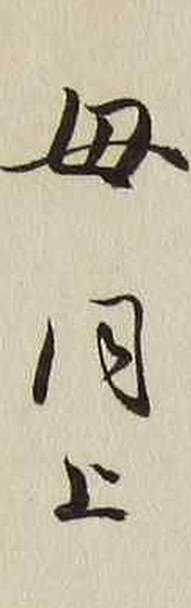母同上
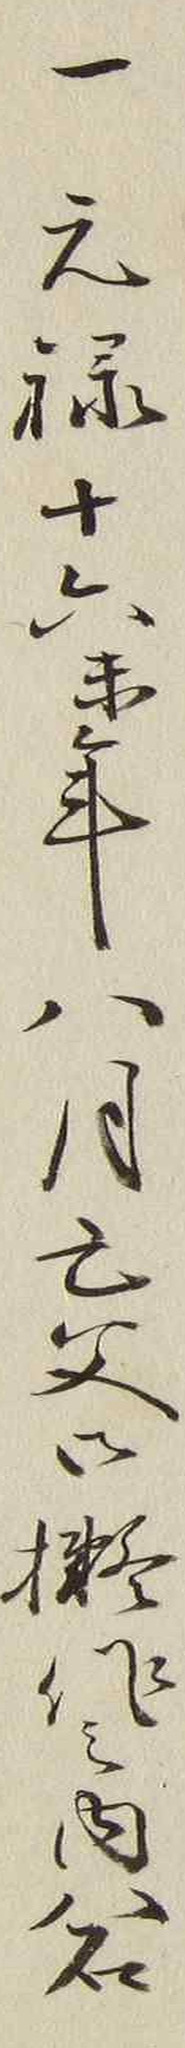一元禄十六未年八月亡父御擬作之内八石

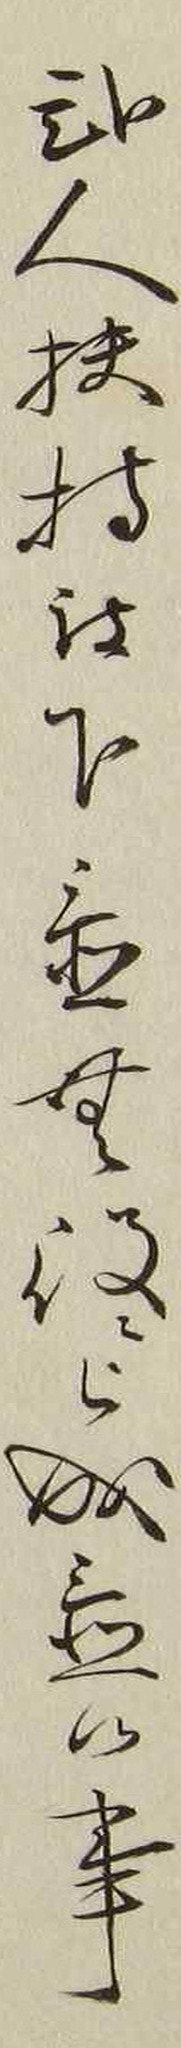弐人扶持被下置無役ニ被成置候事
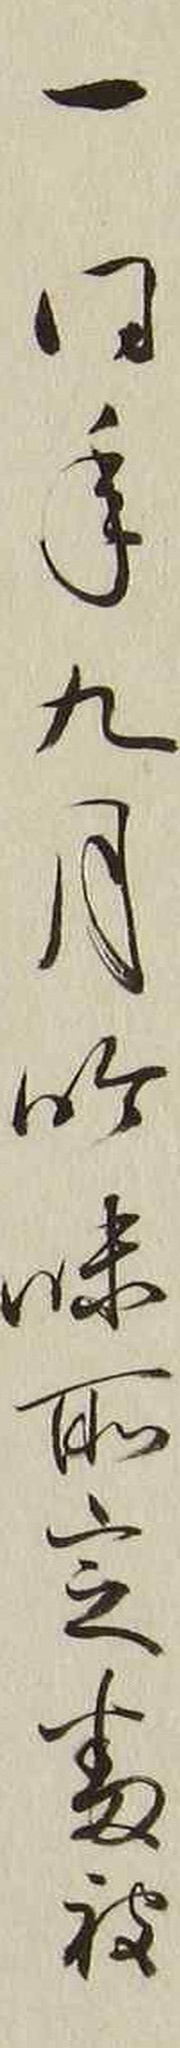一同年九月吟味取定番被
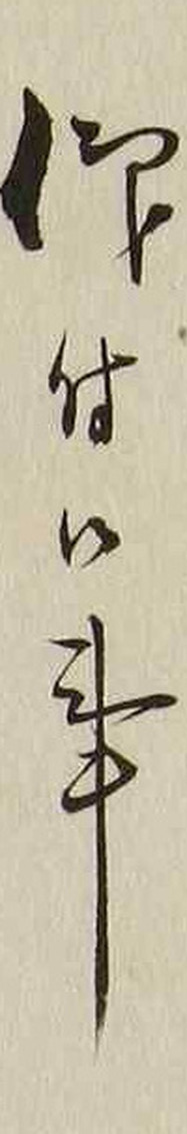仰付候事
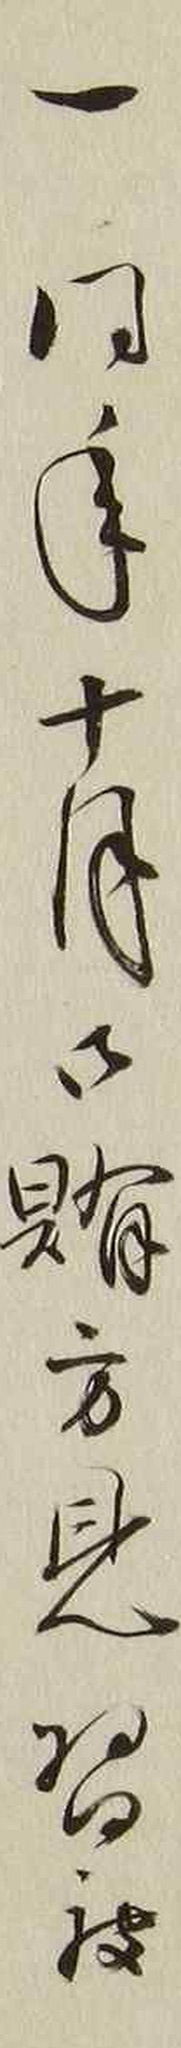一同年十月御賄方見習被
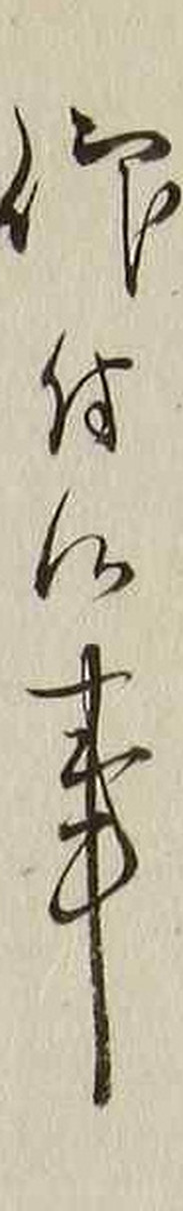仰付候事
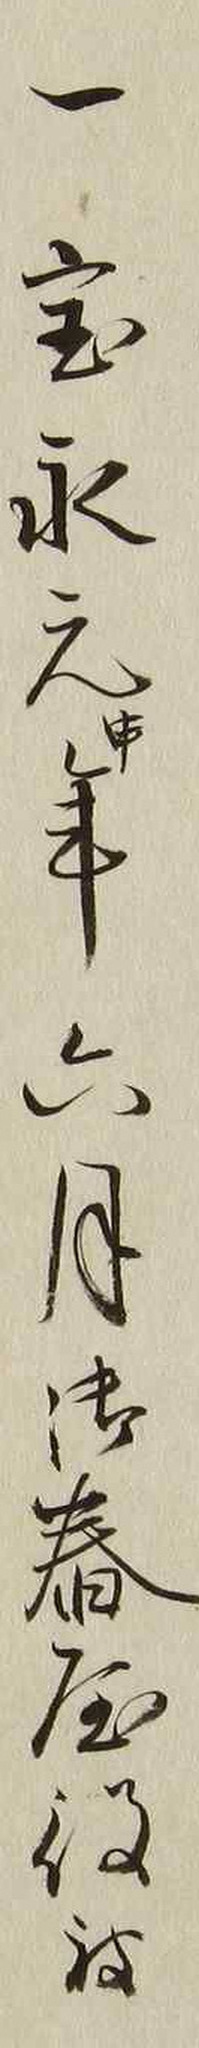一宝永元申年六月御舂屋役被
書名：諸士系譜　巻之163　な之部5
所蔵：会津若松市立会津図書館
